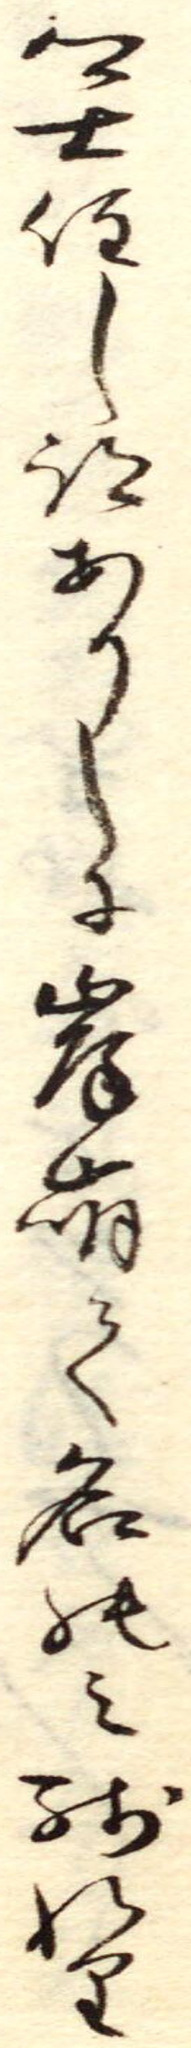郷士住し跡ありしに岸崩て名のみ残れり
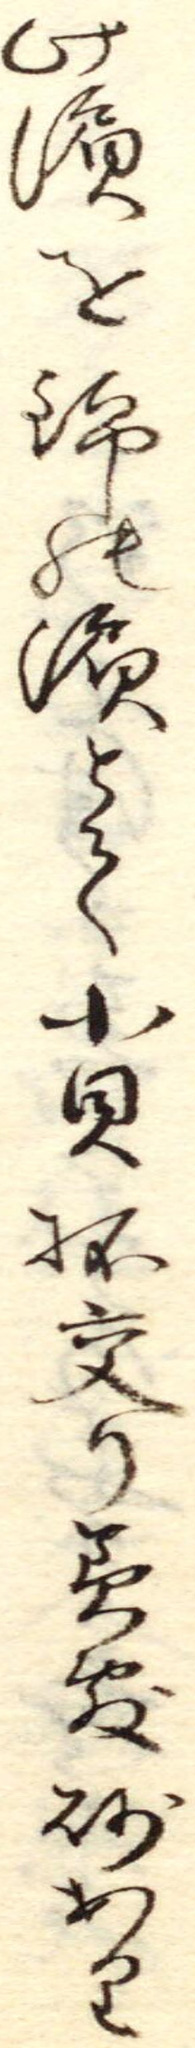此浜を錦の濱とて小貝抔交り美敷砂あり
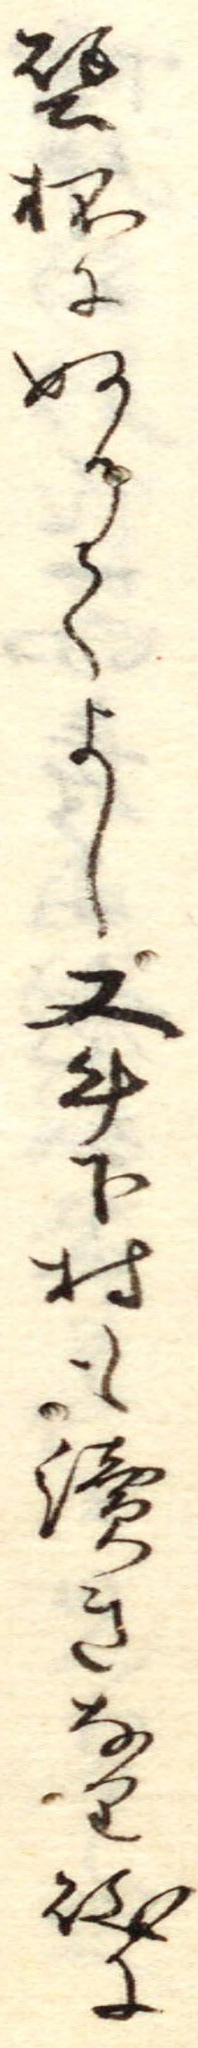壁抔にぬりてよし又牛下村も続きなり礒に
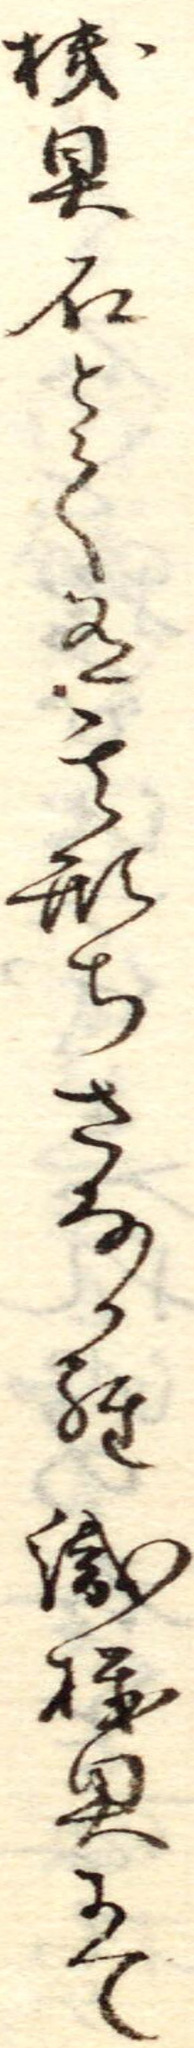機具石とて有其形ちさなから織機具にて
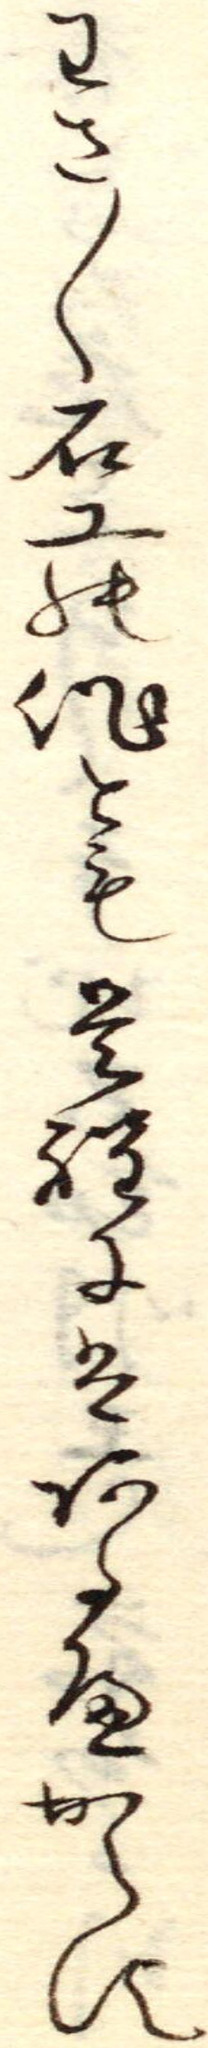わさ〳〵石工の作とも是程にはありへからす
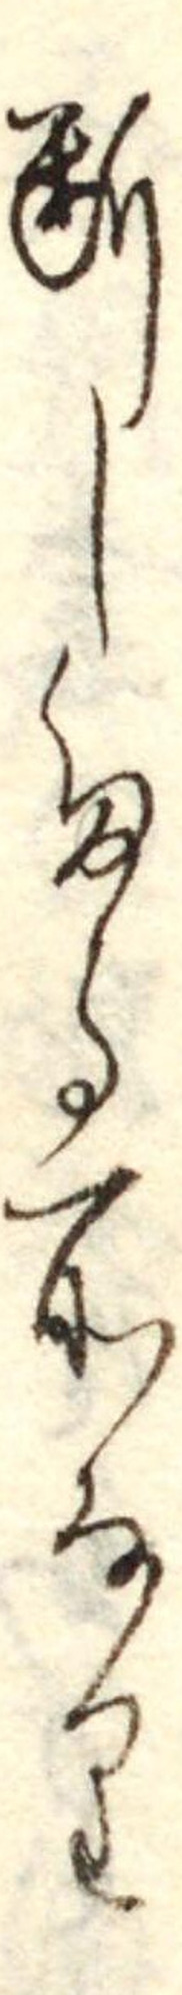断したる所なり
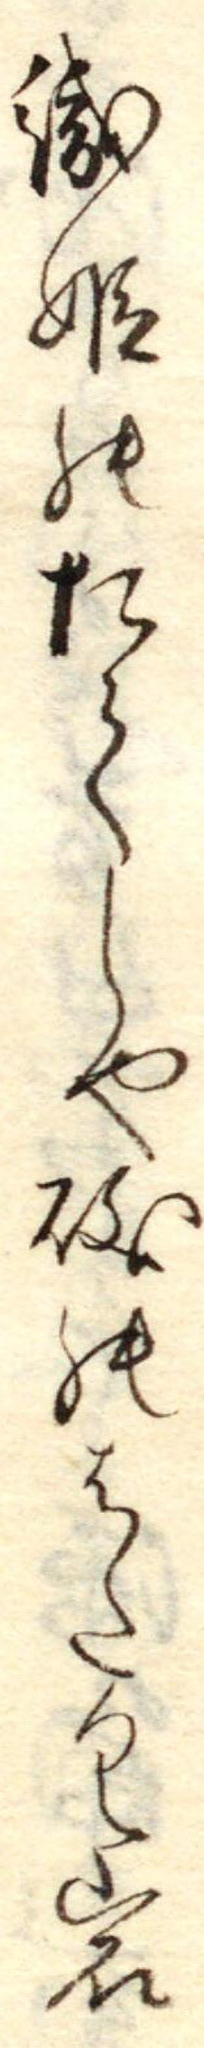織姫のたてしや磯のはた具岩
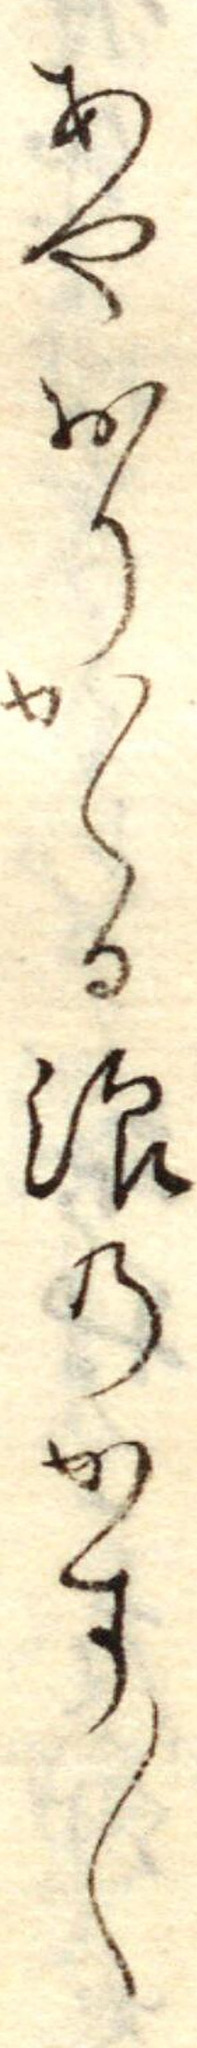あやおりかくる浪のかす〳〵

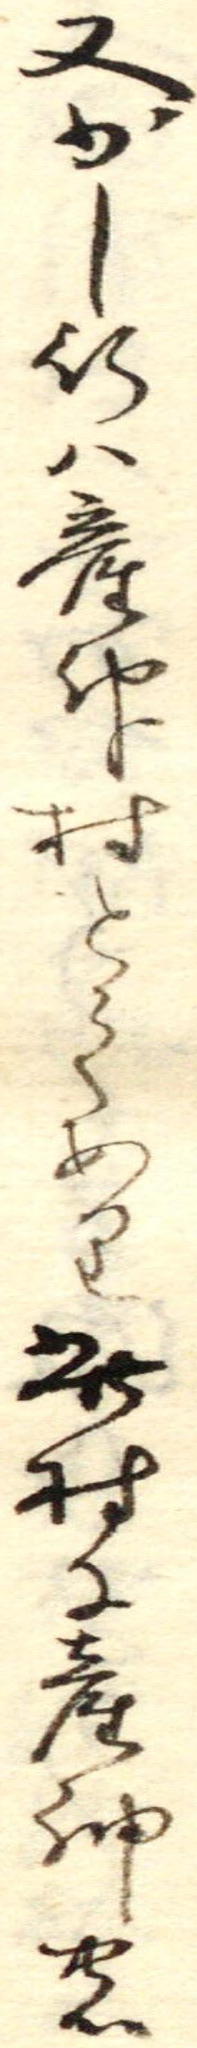又少し行は産神村とてあり此村に産神の
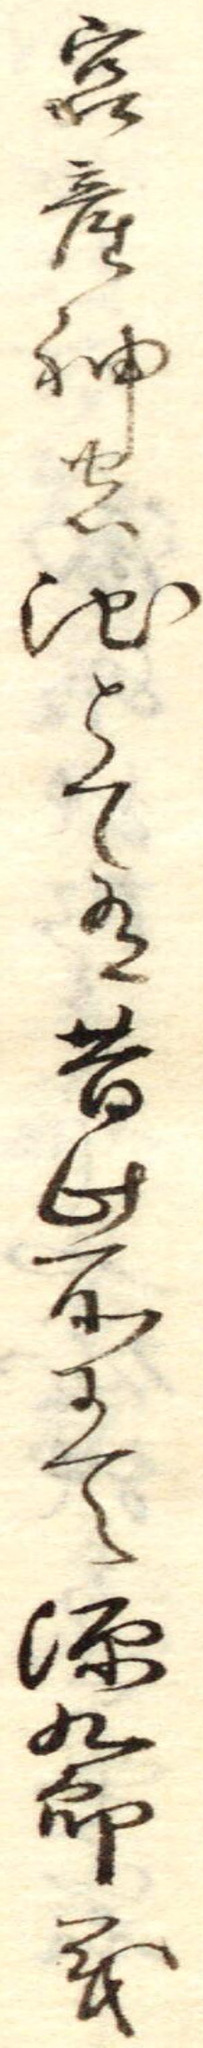宮産神の池とて有昔此所にて源九郎義
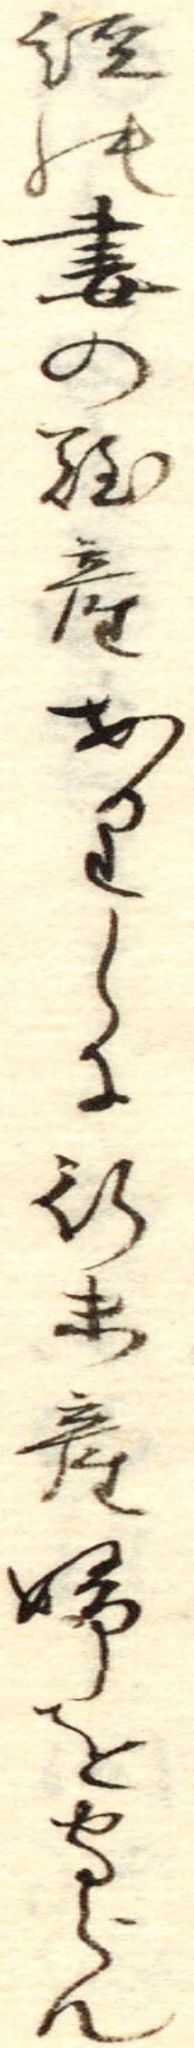経の妻の難産ありしに行末産婦を守らん
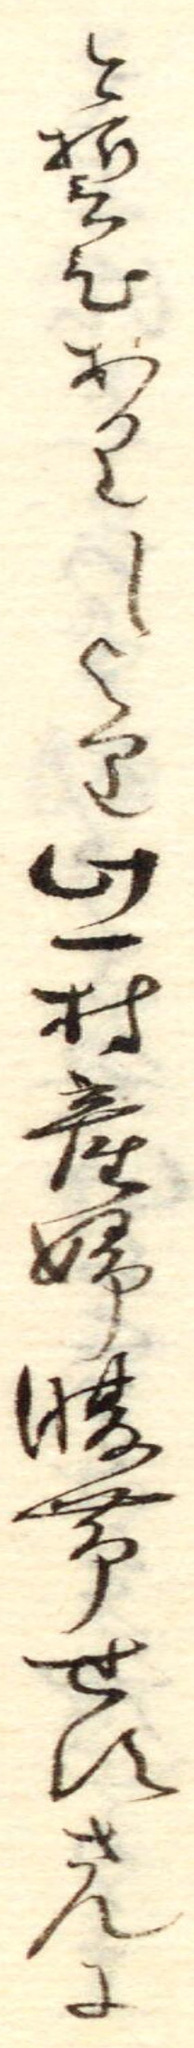と誓ひありしより此一村産婦腹帯せすさんに
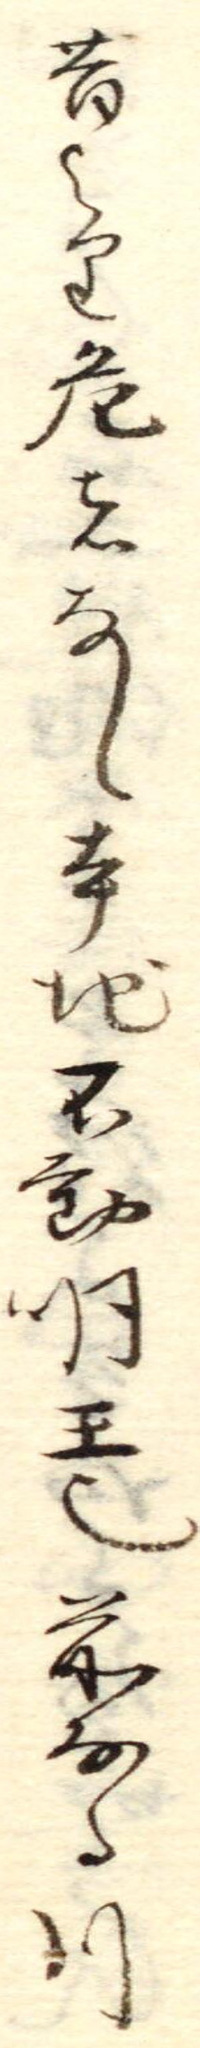昔より危はなし本地不動明王也前なる川
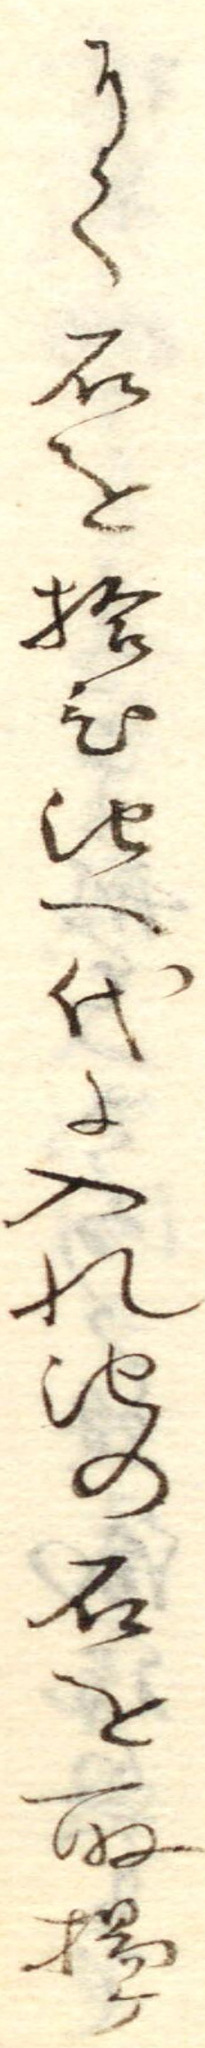にてい石を拾ひ池へ代に入れ池の石を取揚け
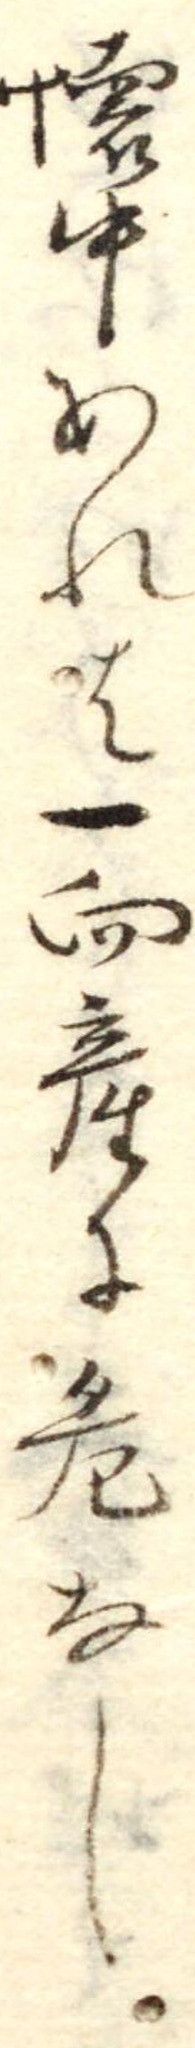懐中あれは一向産に危なし
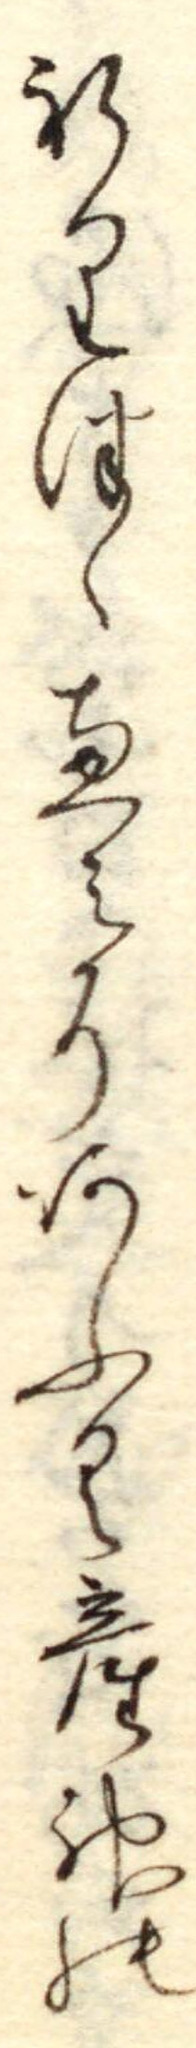祈りつゝ恵みにあふく産神の
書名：能登名跡誌
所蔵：Ishikawa Prefectural Library
